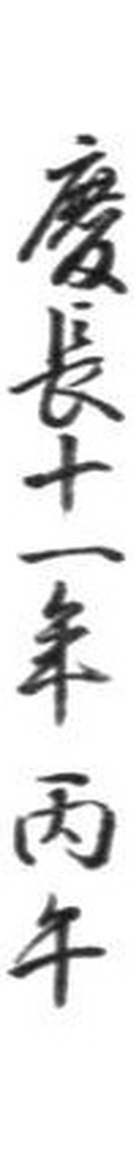慶長十一年丙午
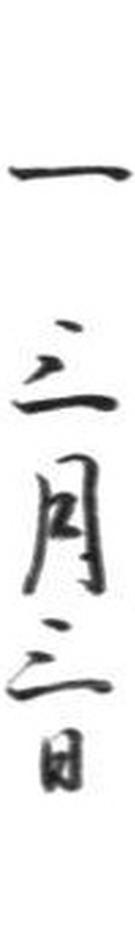一三月三日
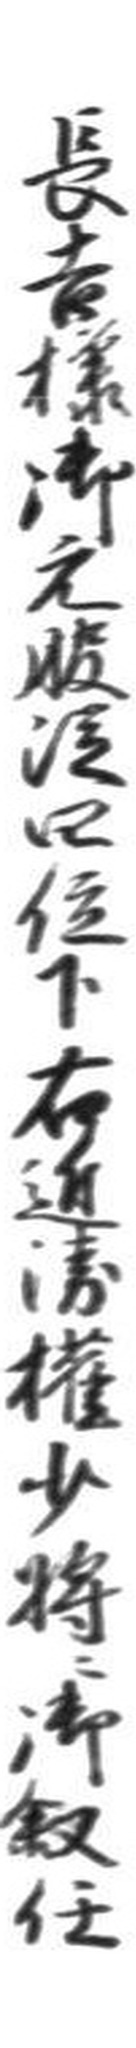長吉様御元服従四位下右近衛権少将ニ御叙任
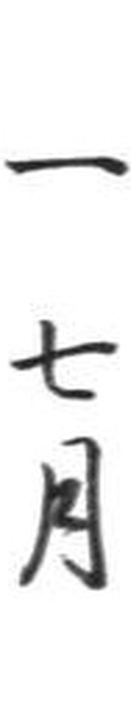一七月
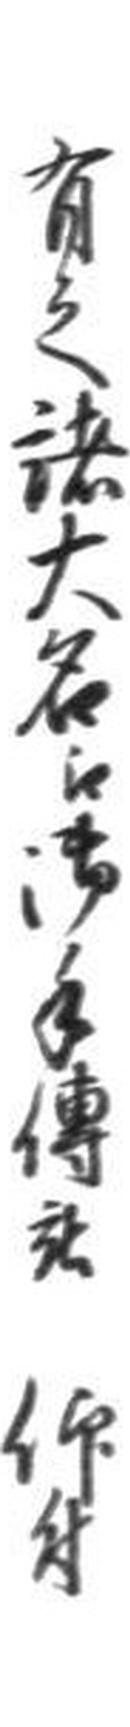有之諸大名江御手伝被仰付
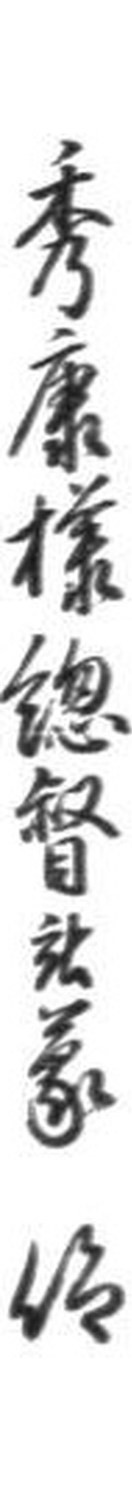秀康様総督被蒙仰
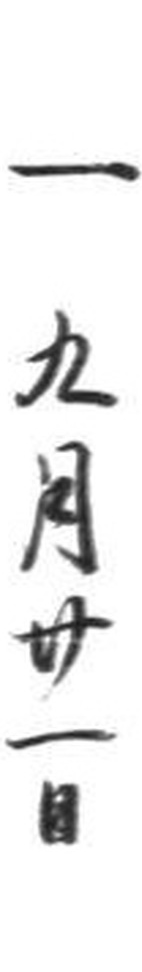一九月廿一日

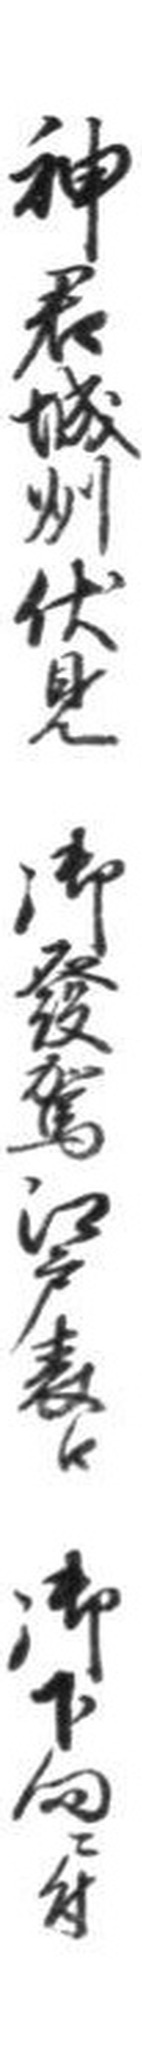神君城州伏見御発駕江戸表江御下向ニ付
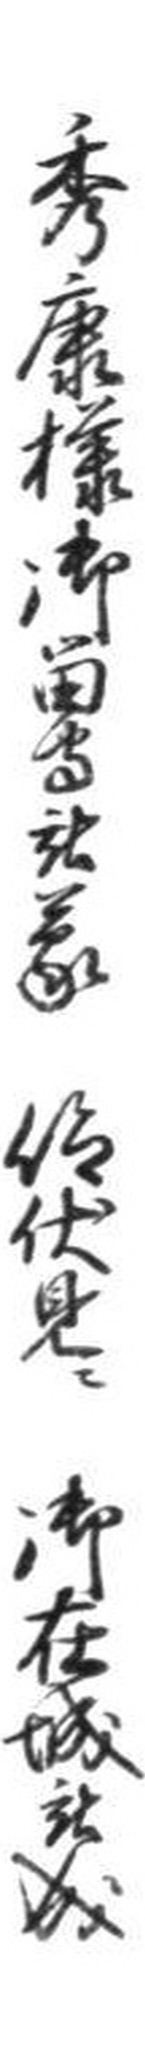秀康様御留守被蒙仰伏見ニ御在城被成
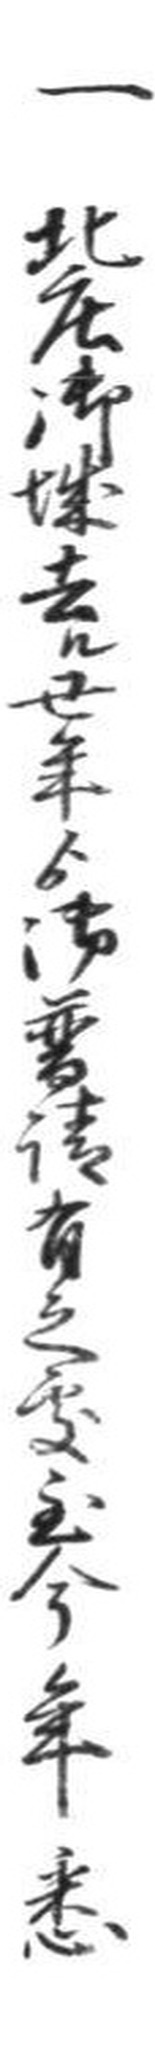一北庄御城去ル丑年ゟ御普請有之処至今年悉
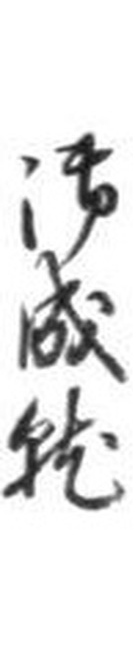御成就
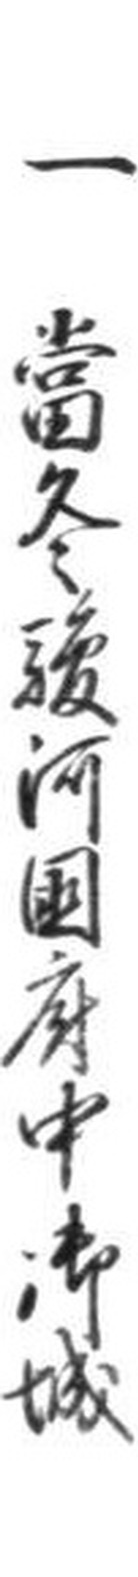一当冬駿河国府中御城
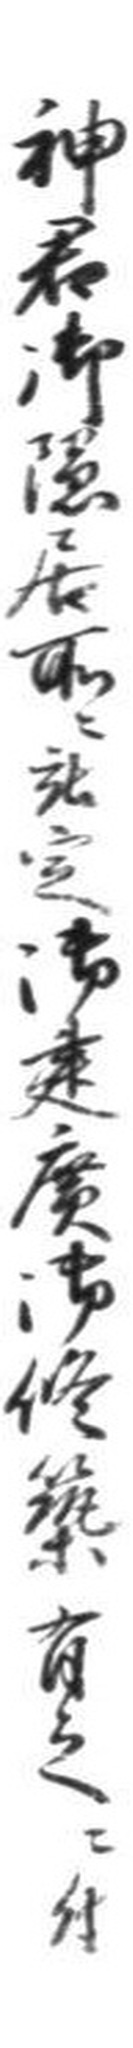神君御隠居所ニ被定御建広御修築有之ニ付
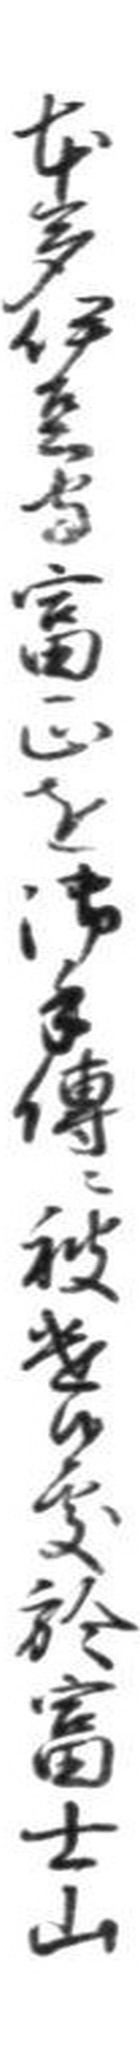本多伊豆守富正を御手伝ニ被遣候処於富士山
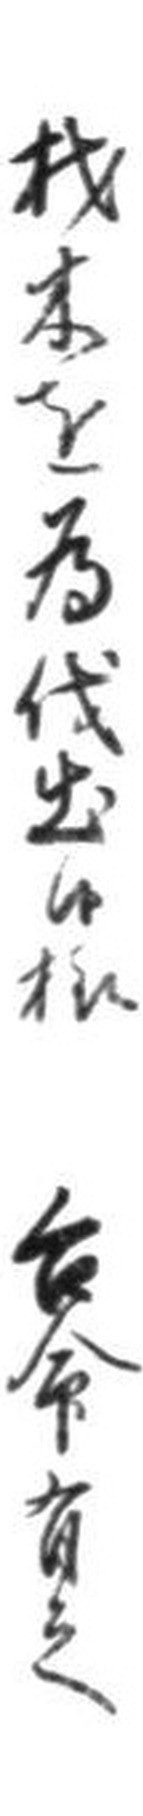材木を為伐出候様台命有之
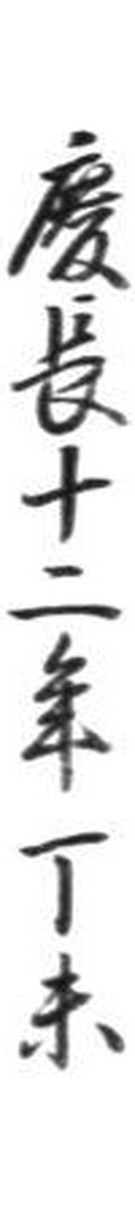慶長十二年丁未
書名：家譜 一 秀康公 従天正二年到慶長十二年
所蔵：福井県文書館 Fukui Prefectural Archives
